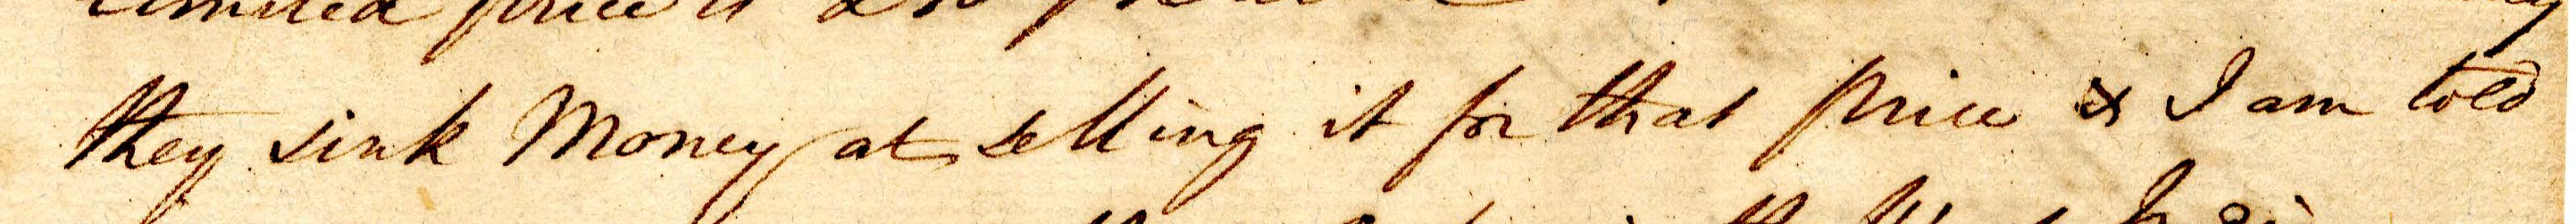they sink Money at selling it for that price & I am told
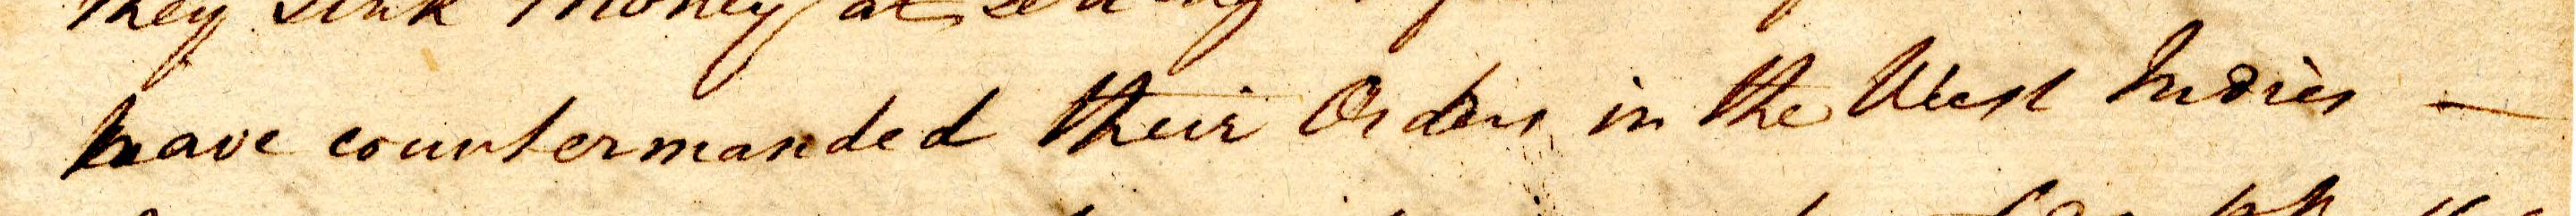have countermanded their Orders in the West Indies.
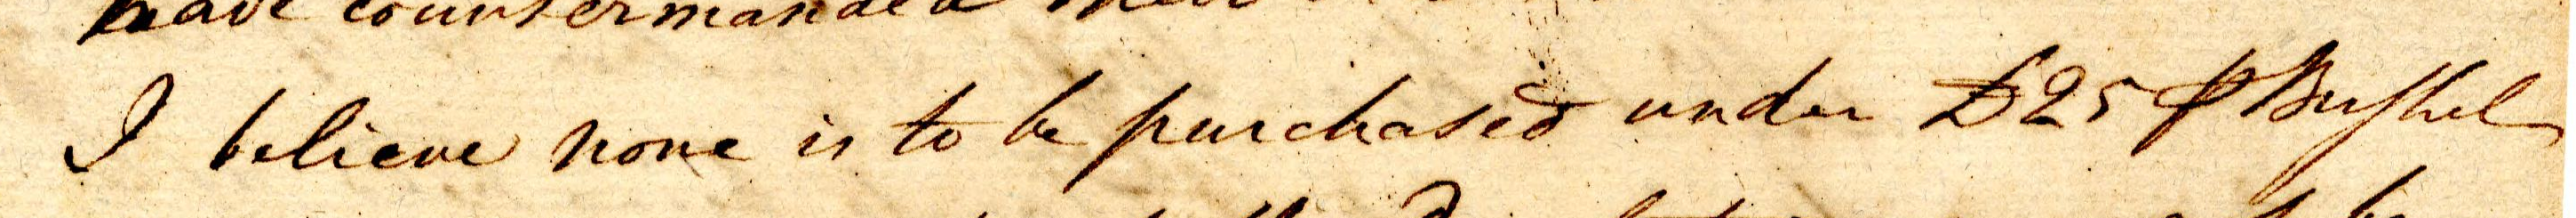I believe none is to be purchased under £25 per Bushel
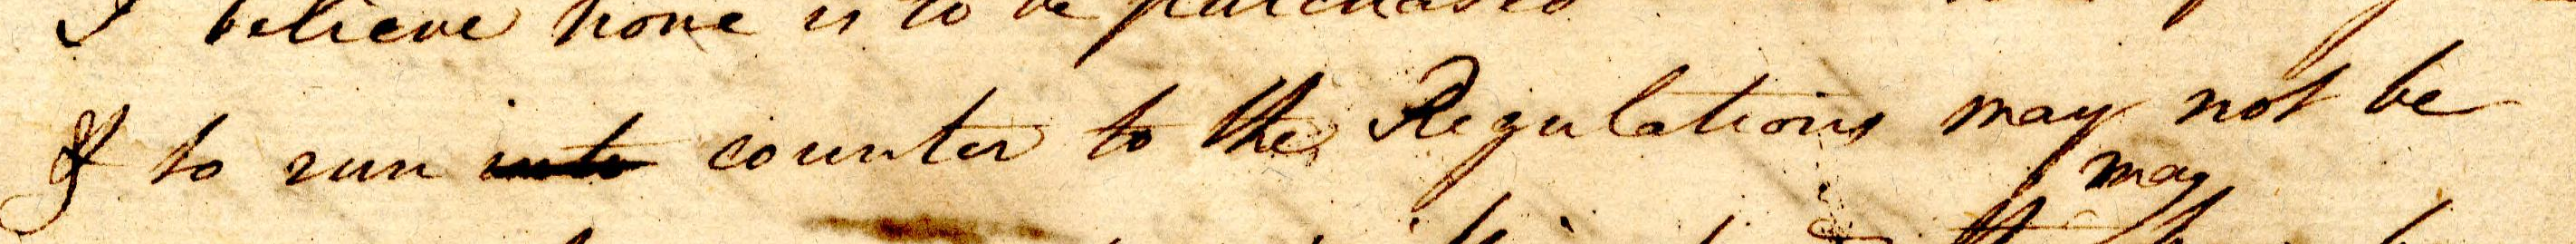& to run into counter to the Regulations may not be
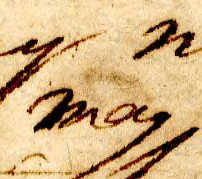may
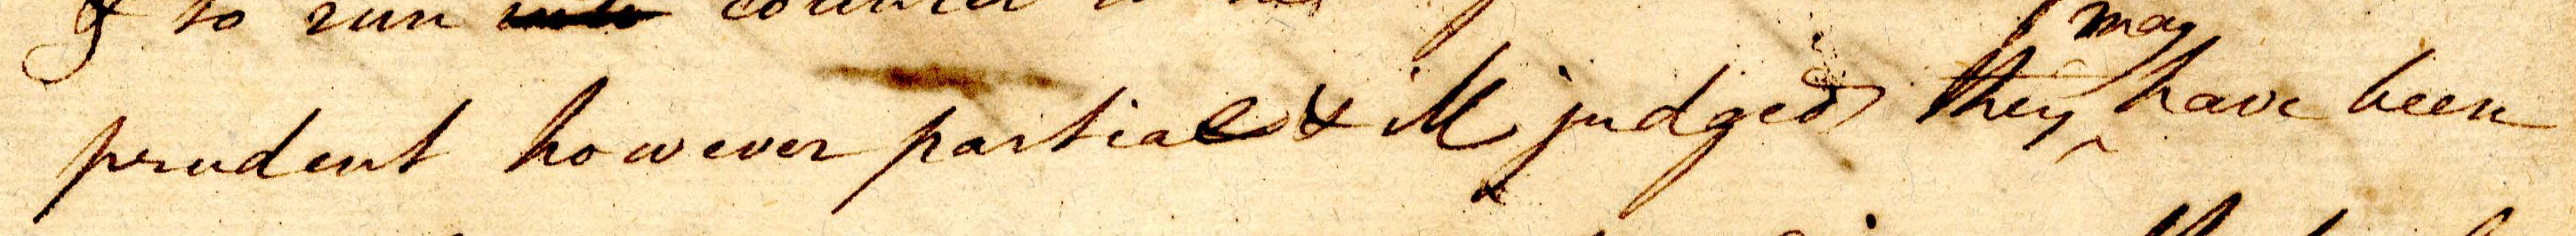prudent however partial & ill judged they ^ have been
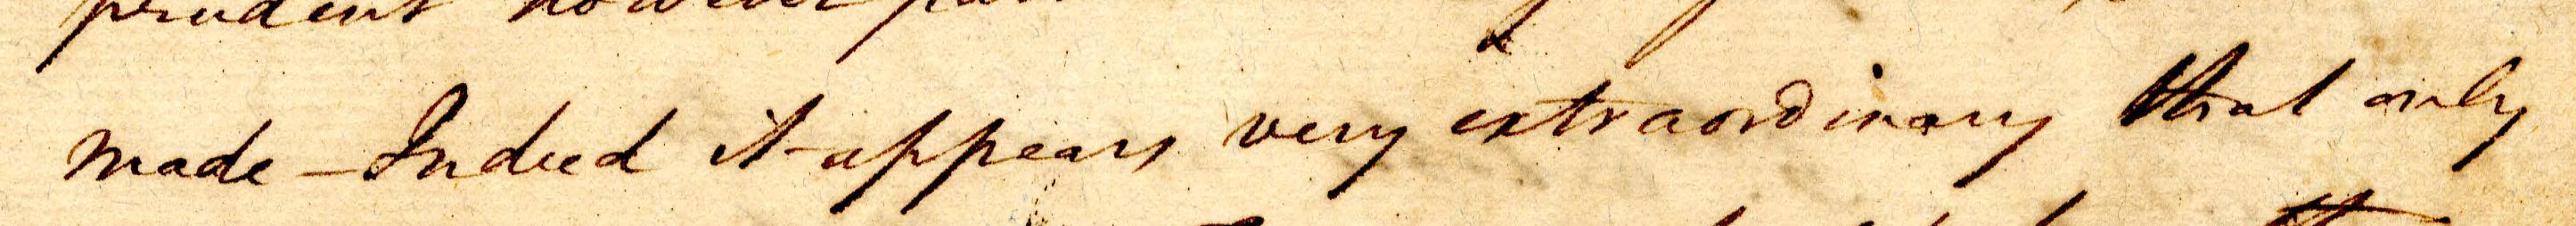made. Indeed it appears very extraordinary that only
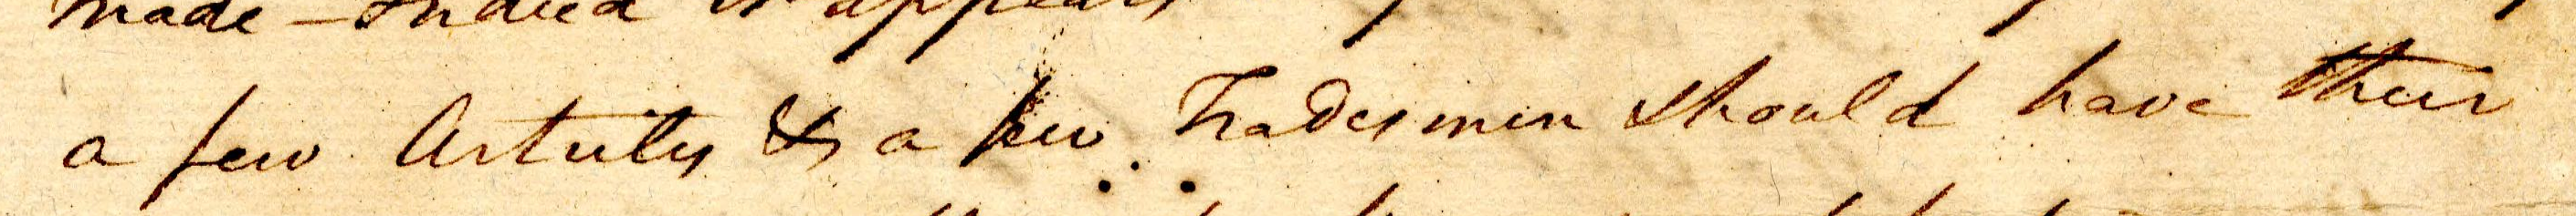a few Articles & a few Tradesmen should have their
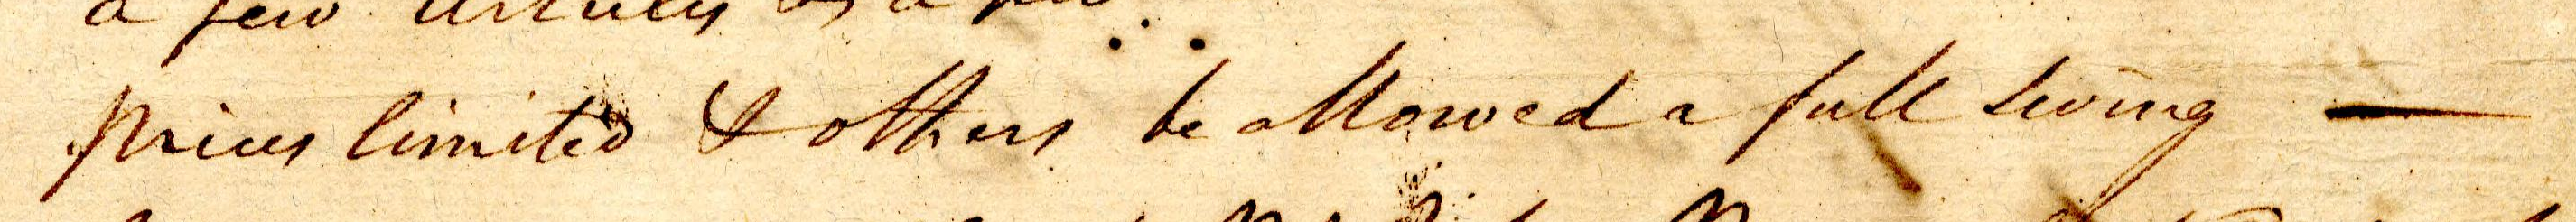prices limited & others be allowed a full swing.
